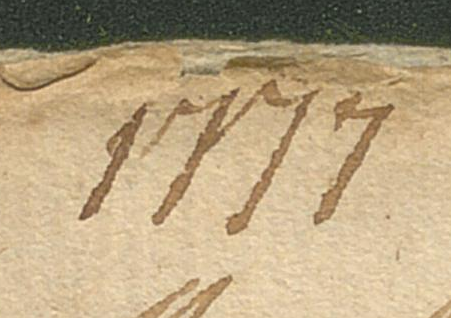1777
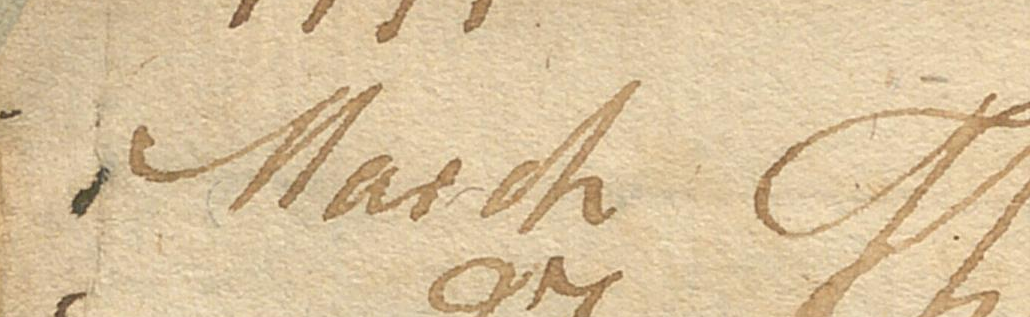March
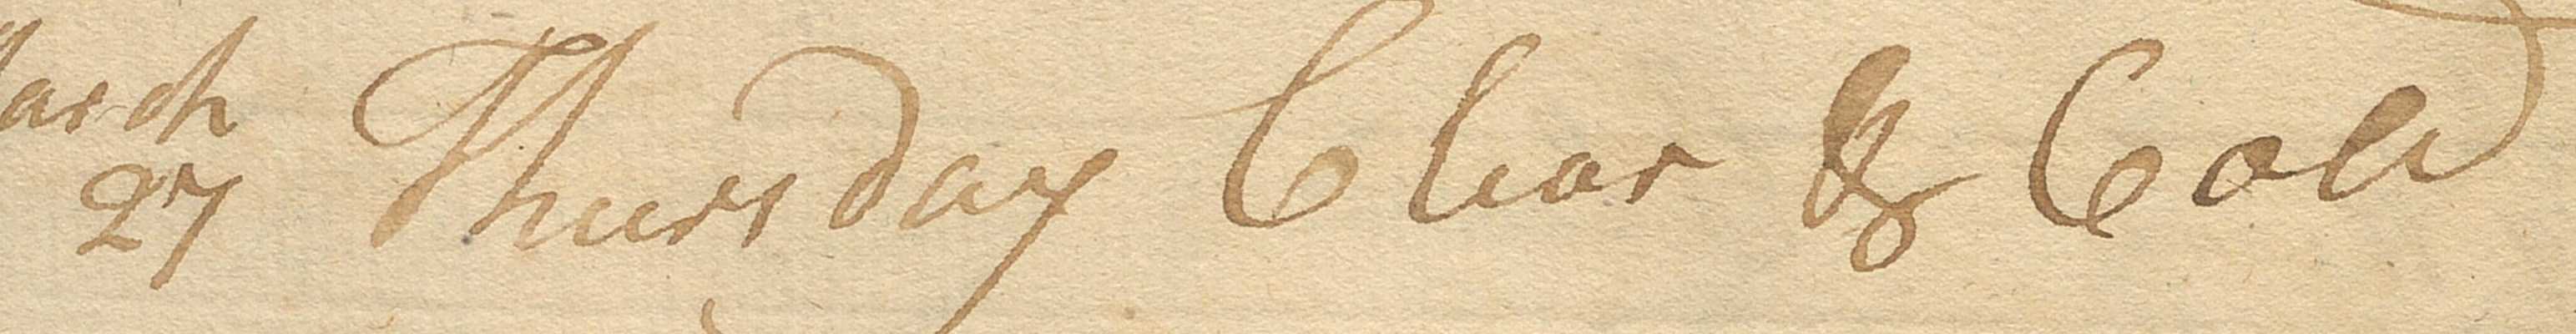27 Thursday Clear & Cold
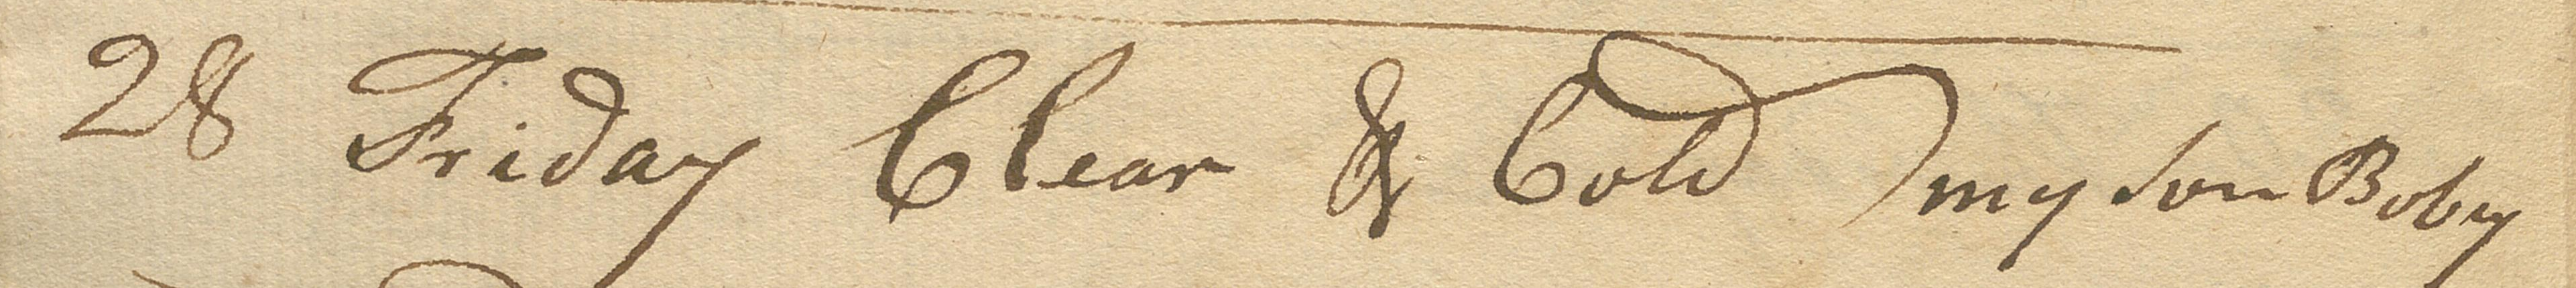28 Friday Clear & Cold my son Bobey
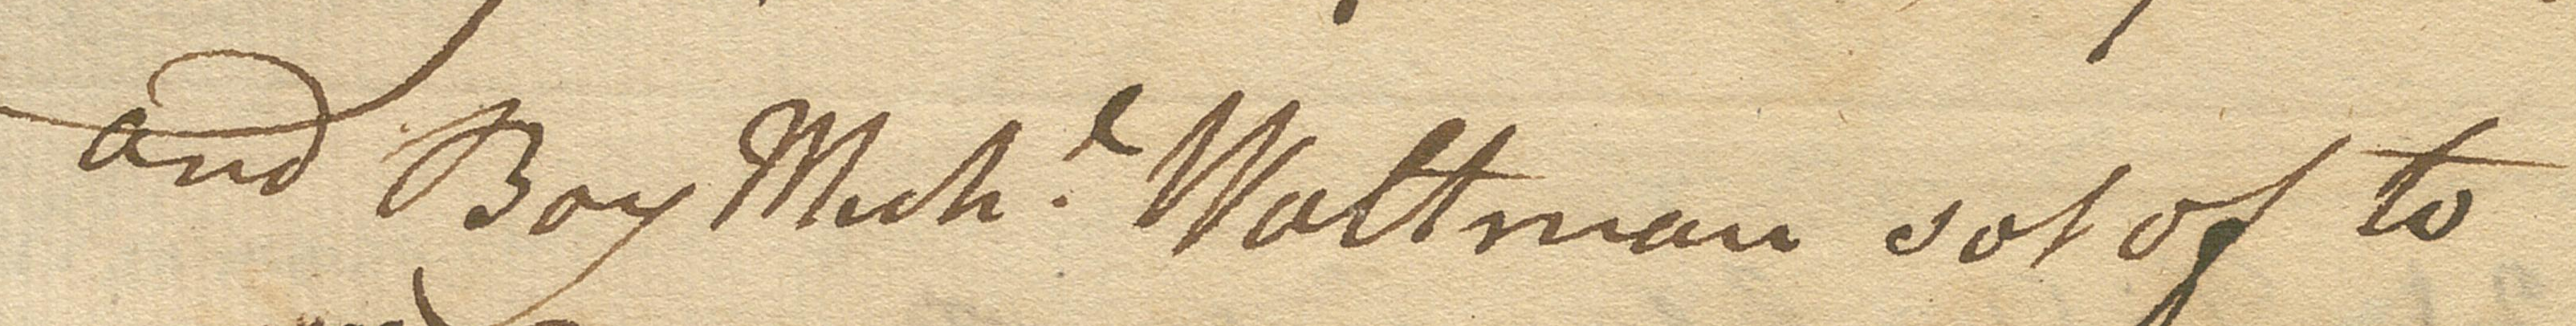and Boy Mich^l. Waltman set of to
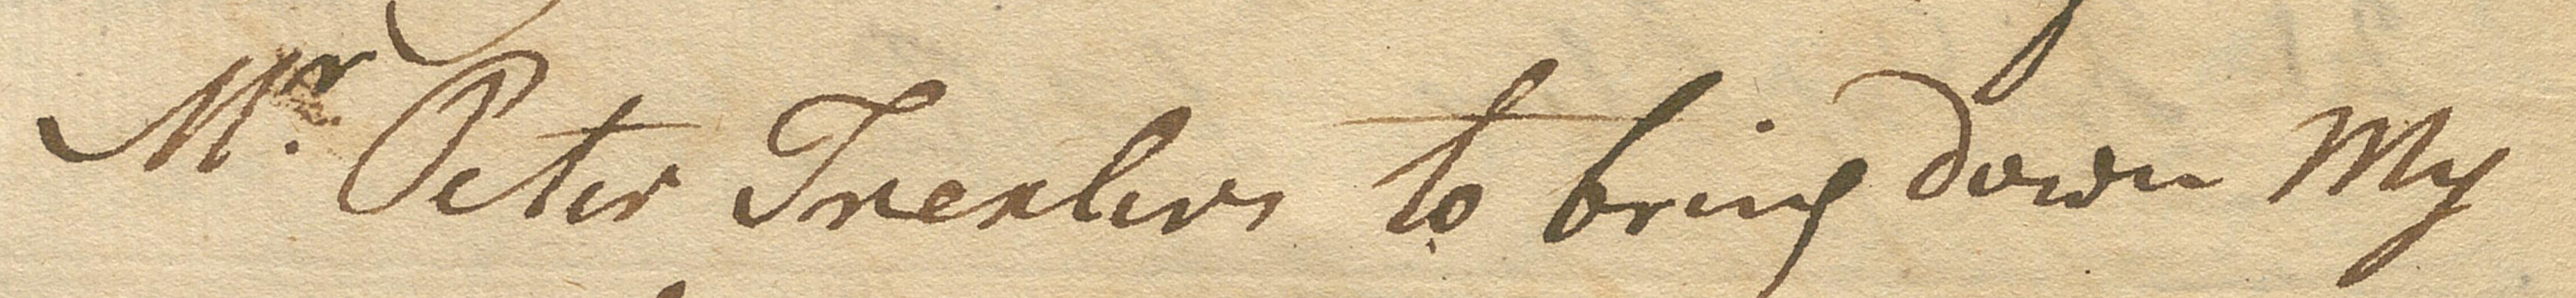M^r. Peter Trenlers to bring down My
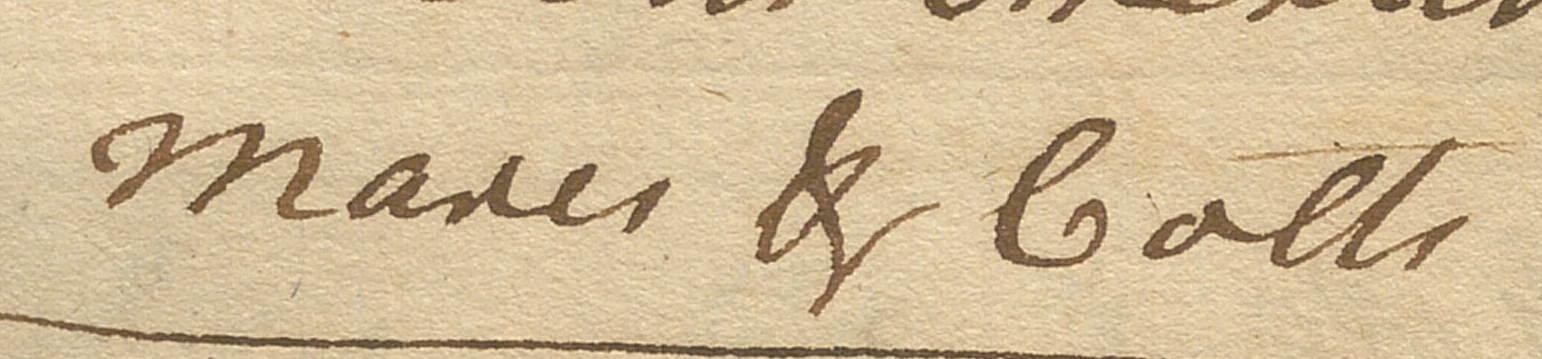Mares & Colts
